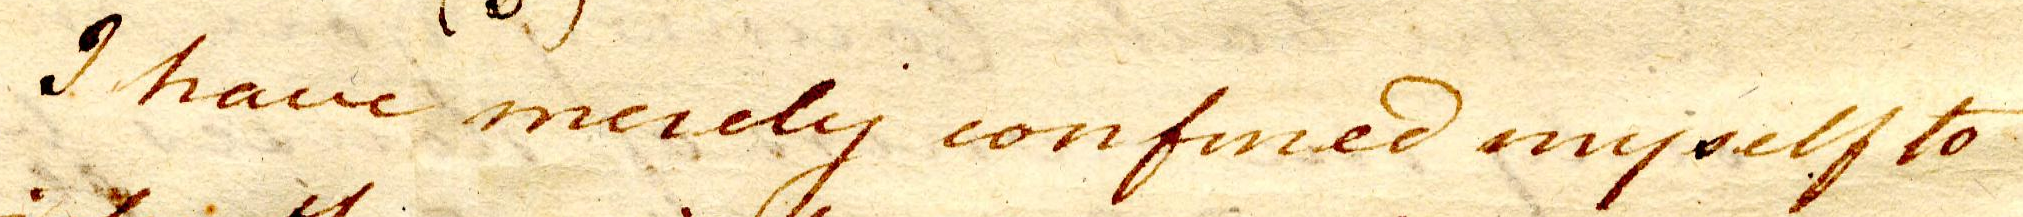I have merely confined myself to
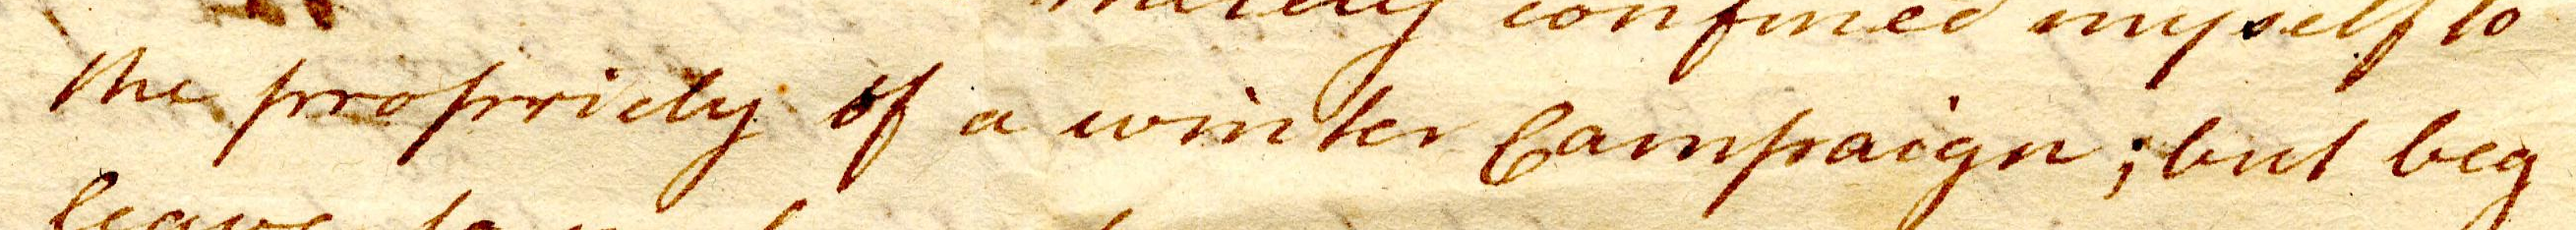the propriety of a winter Campaign; but beg
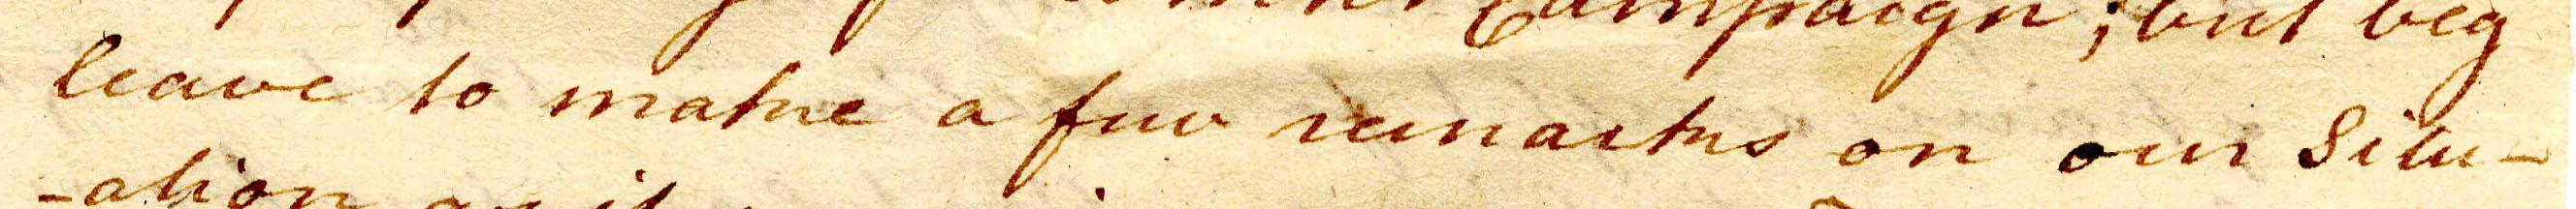leave to make a few remarks on our situ-
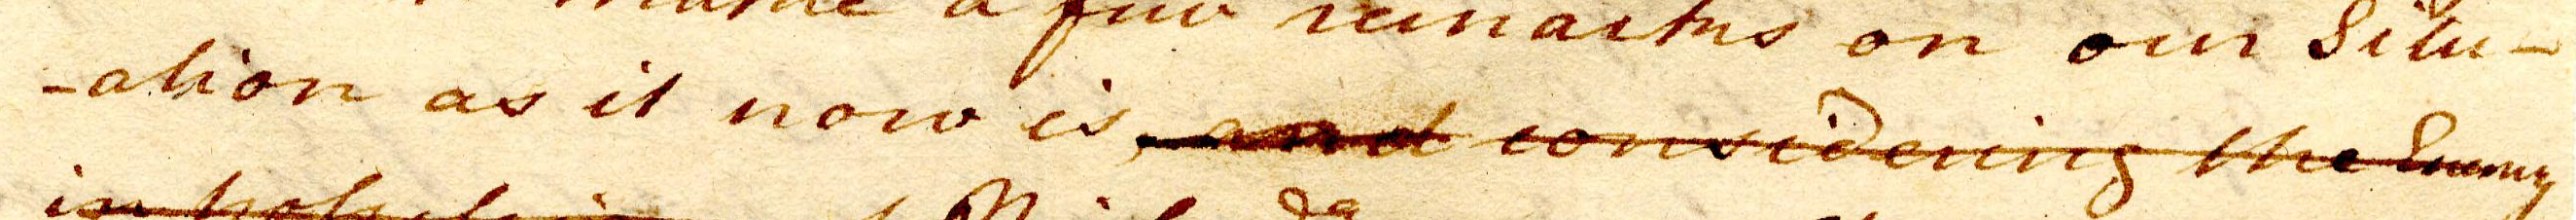-ation as it now is, [and considering the Enemy]
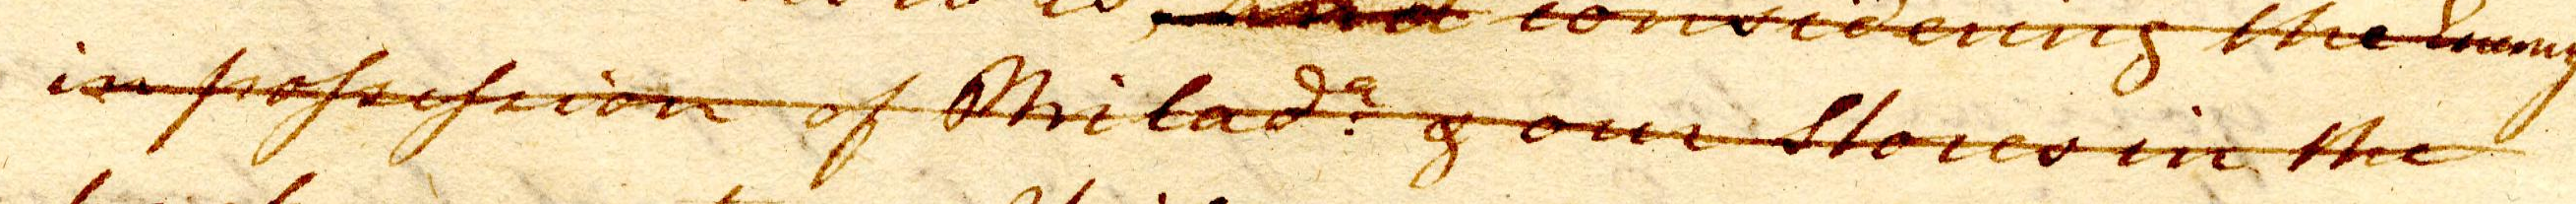[in possession of Philad^a: & our Stores in the]
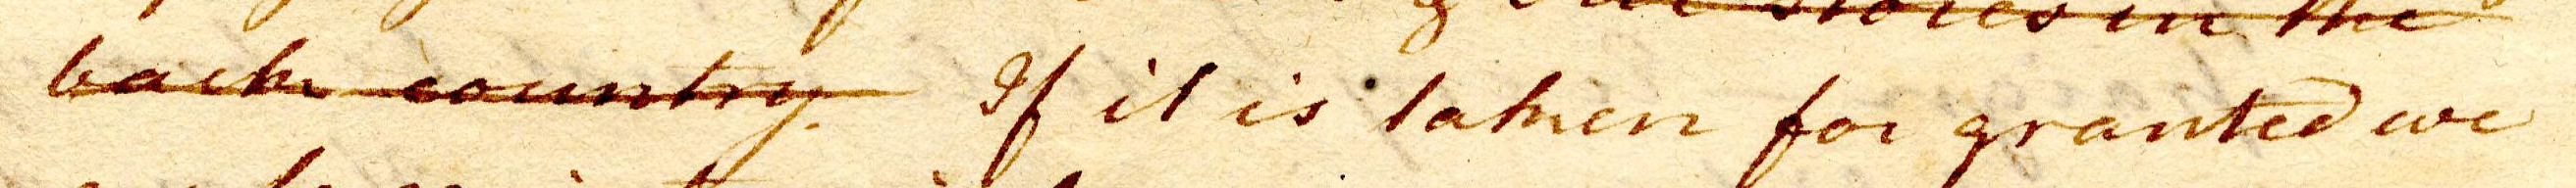[back-country.] If it is taken for granted we
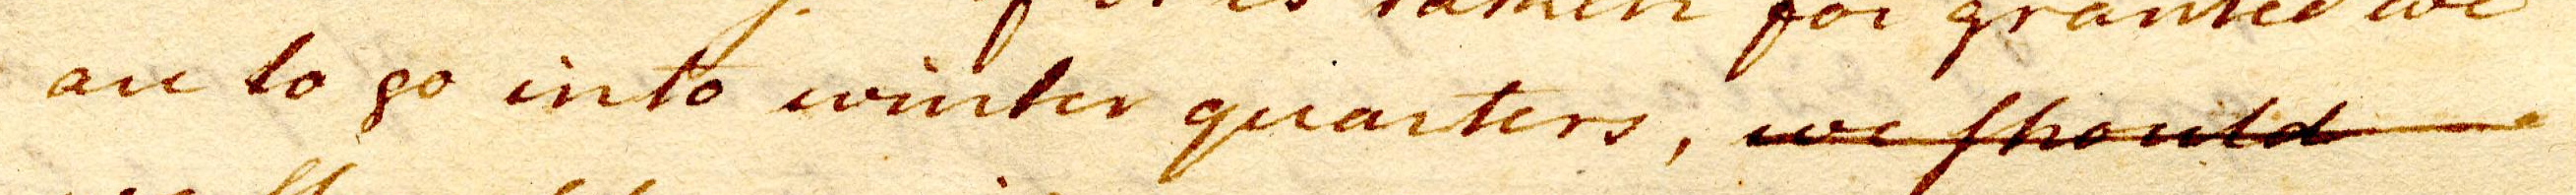are to go into winter quarters, [we should]
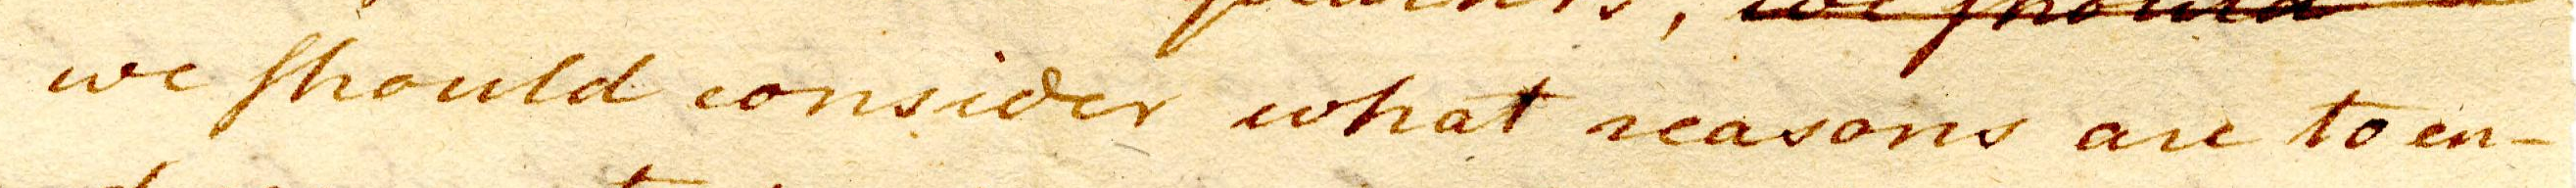we should consider what reasons are to en-
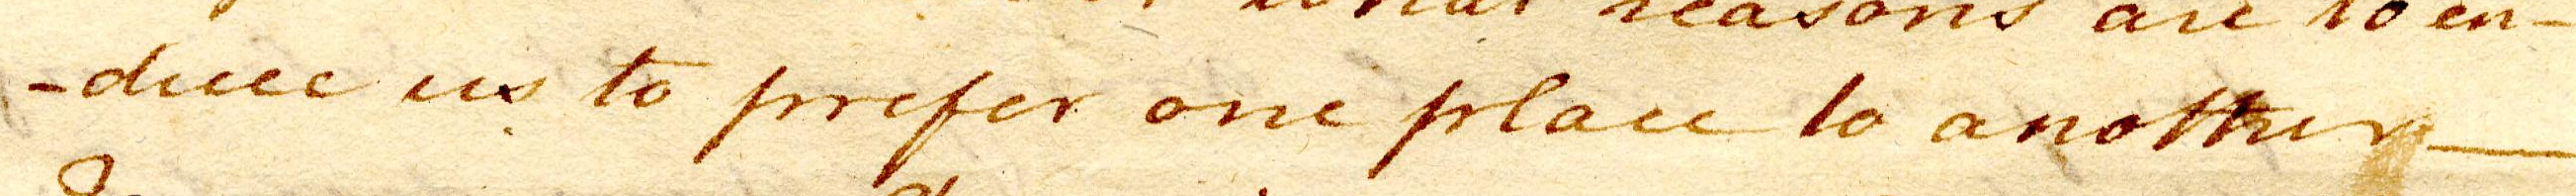-duce us to prefer one place to another-
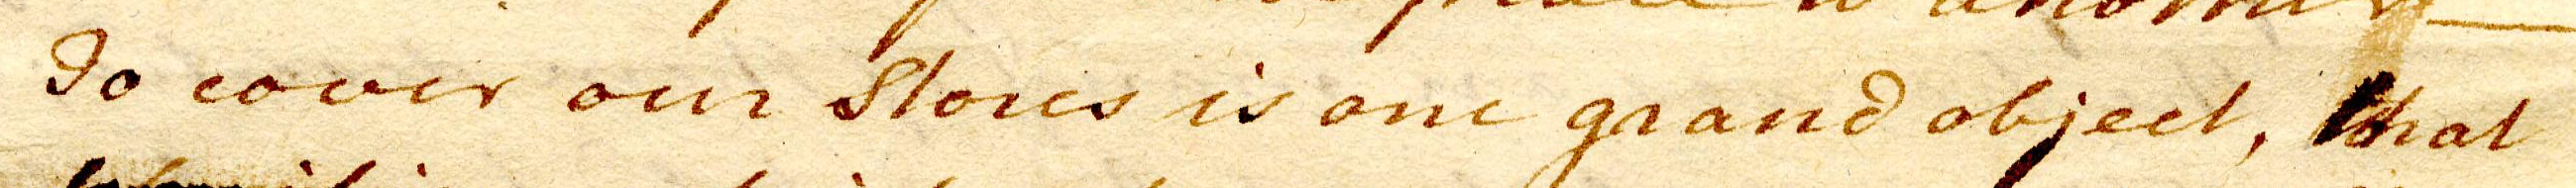To cover our Stores is one grand object, that
